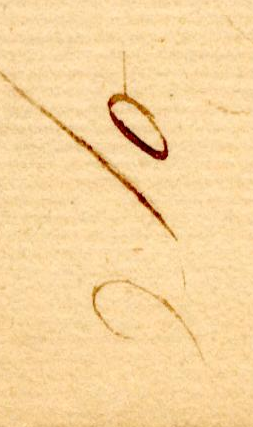To
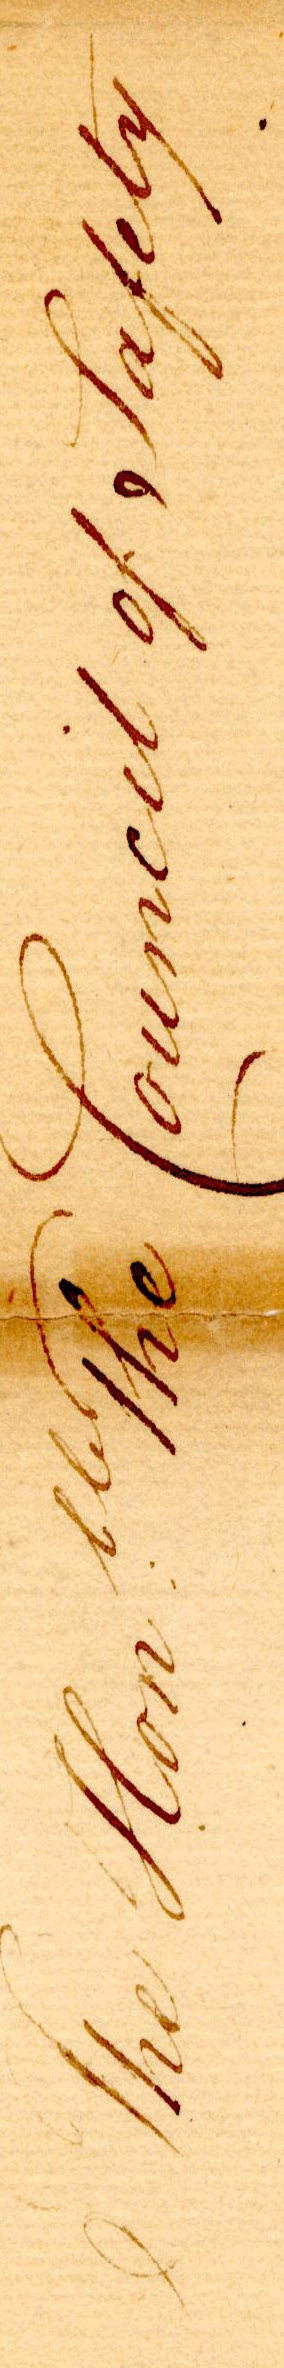The Hon^ble: The Council of Safety
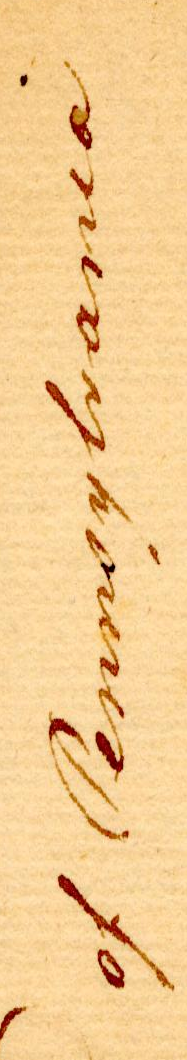of Pennsylvania
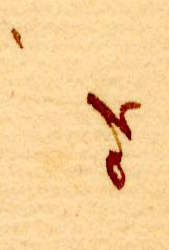at
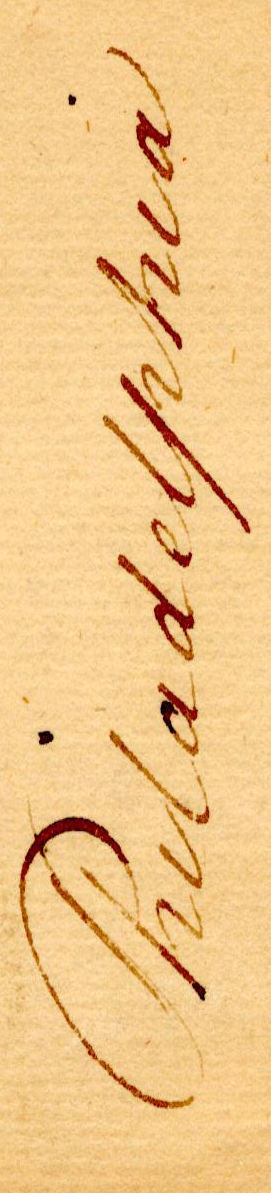Philadelphia
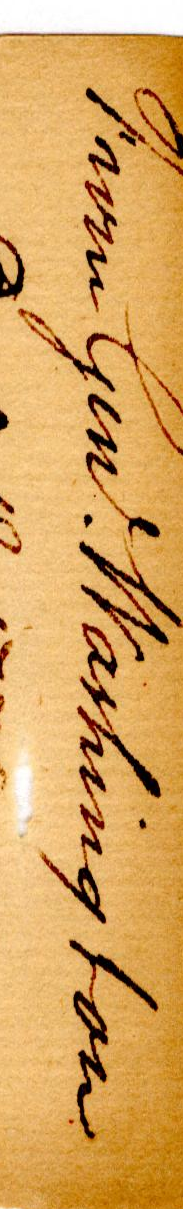From Gen^l. Washington
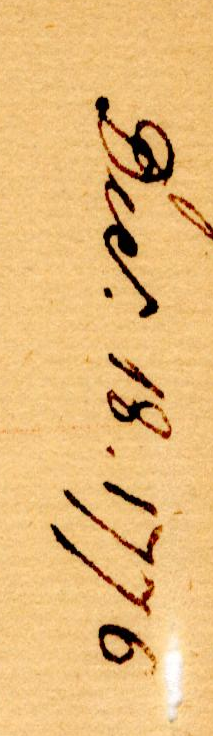Dec. 18. 1776
